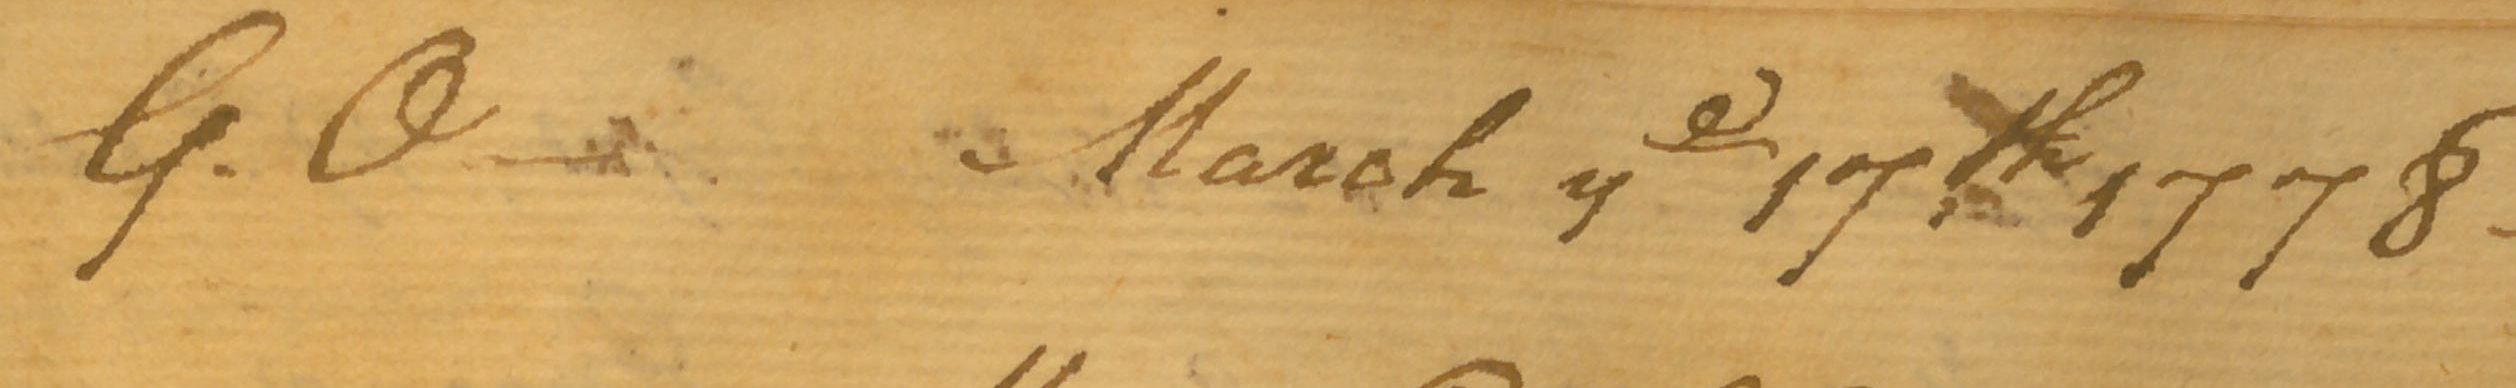G. O March y^e 17^th 1778
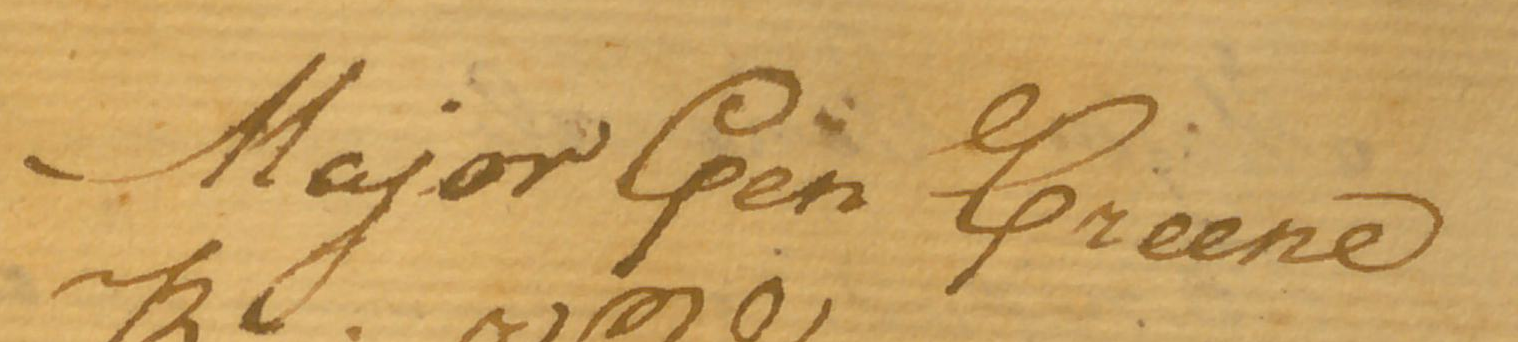Major Gen^l Greene
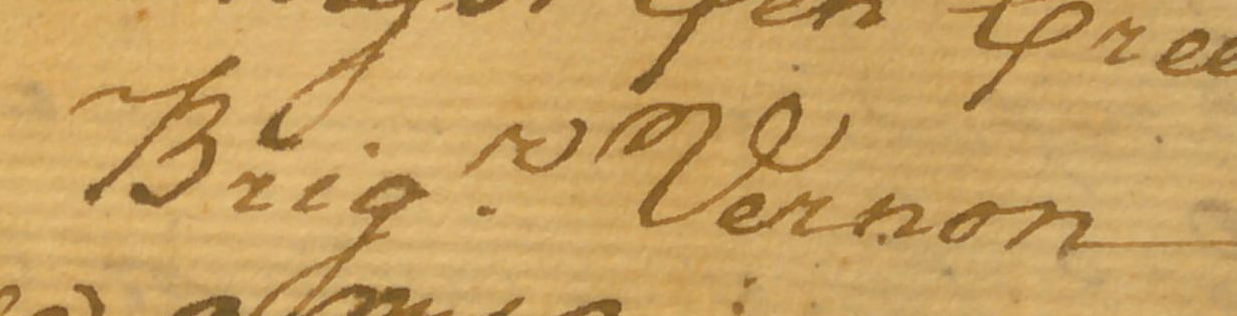Brig^r. Vernon
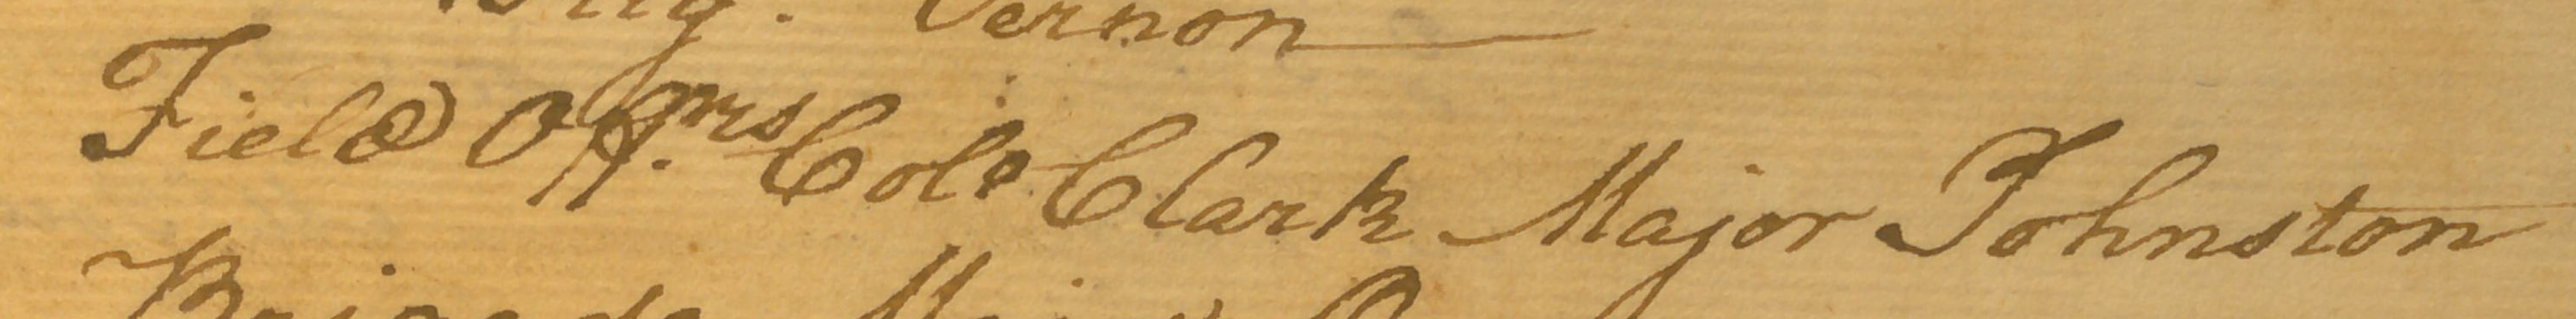Field Off^rs. Col^o Clark Major Johnston
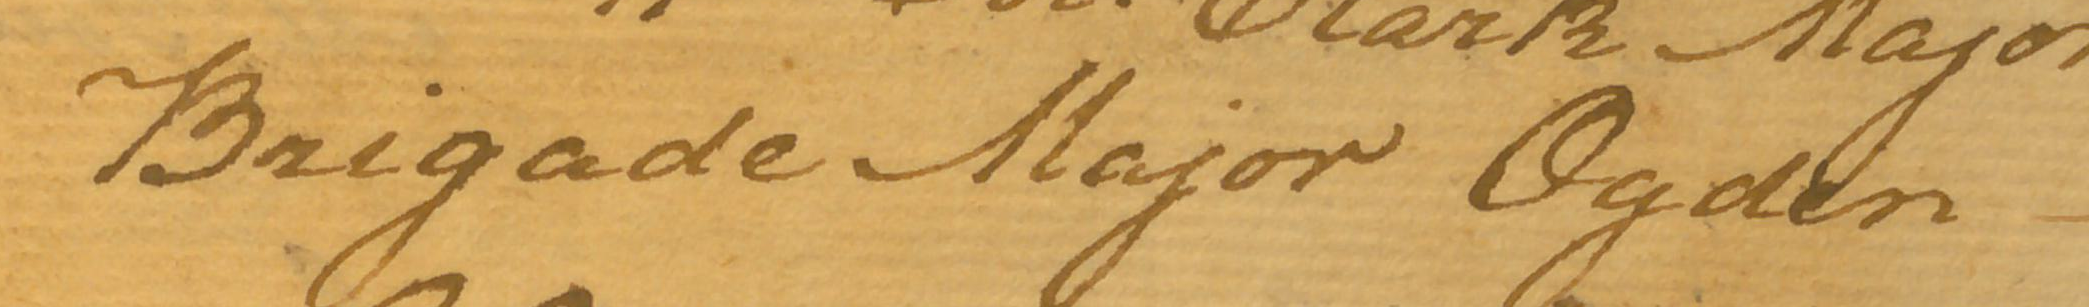Brigade Major Ogden
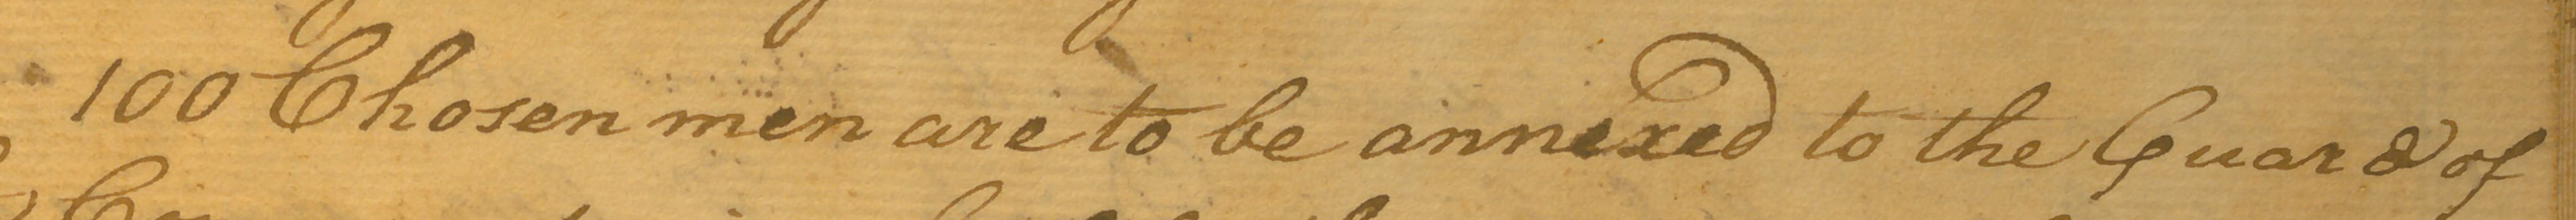100 Chosen men are to be annexed to the Guard of
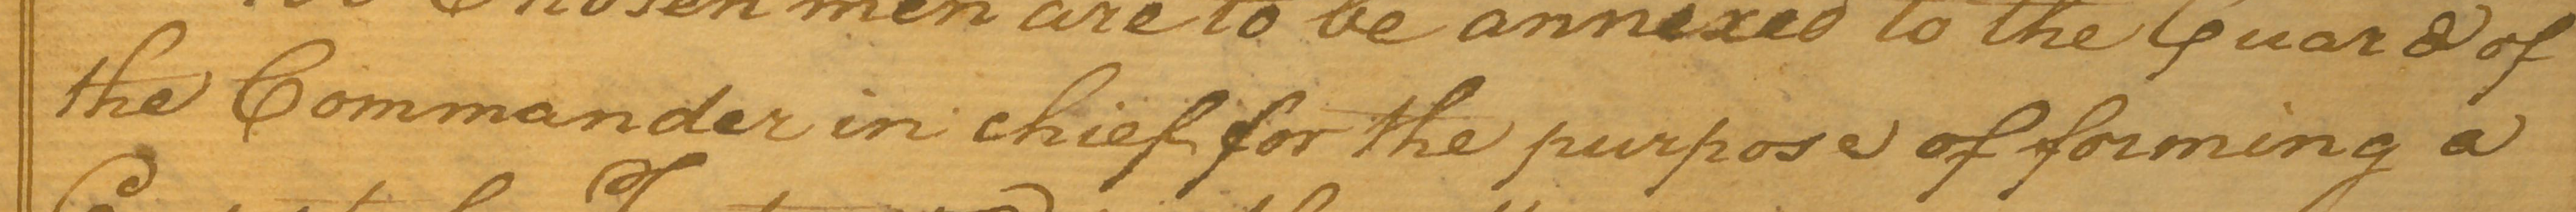the Commander in chief for the purpose of forming a
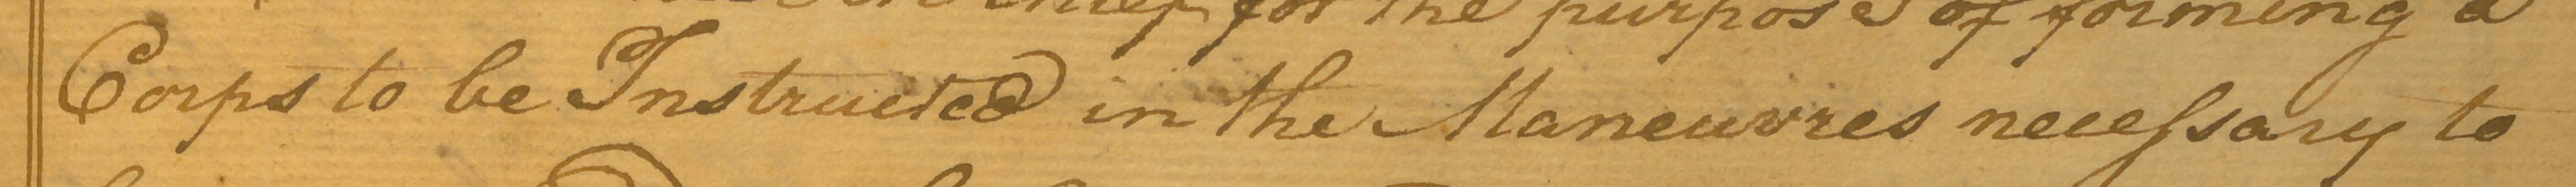Corps to be Instructed in the Maneuvres necessary to
